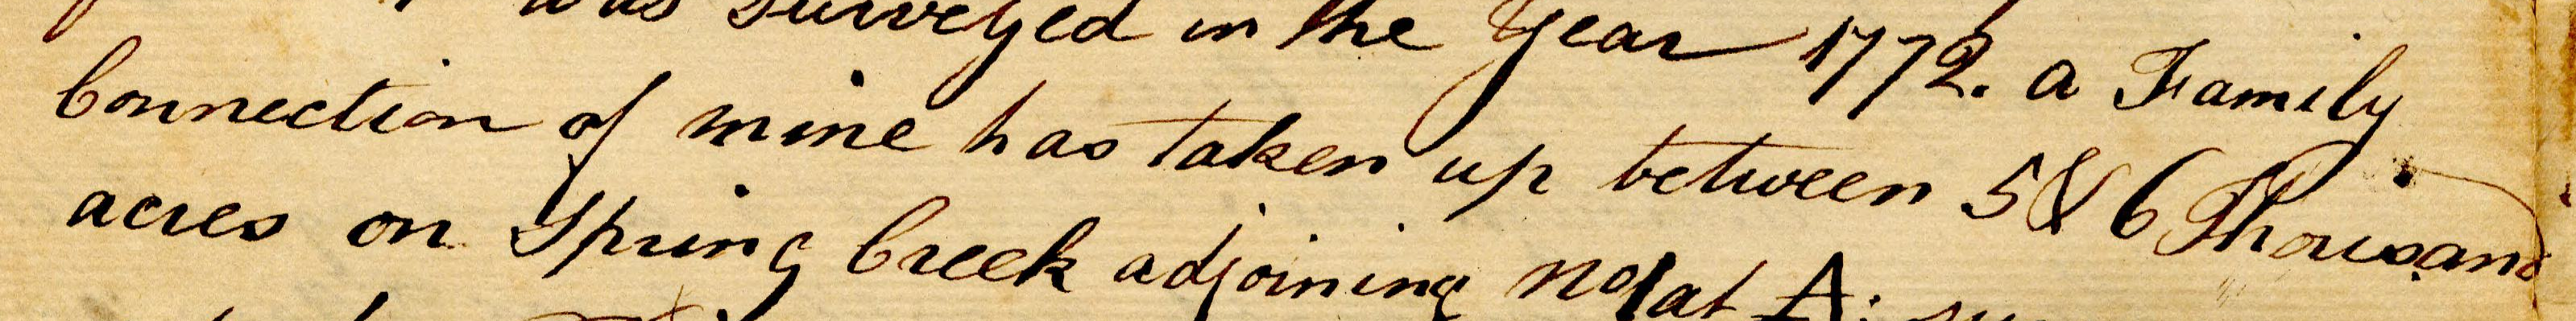Connection of mine has taken up between 5 & 6 Thousand
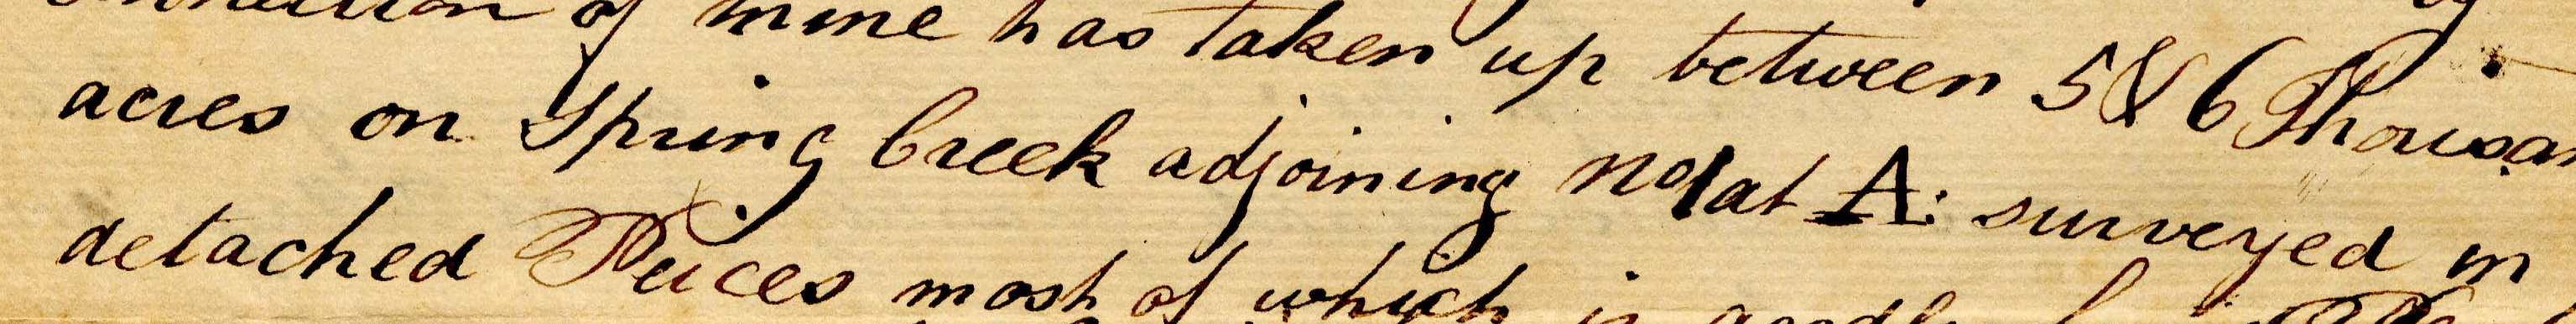acres on spring Creek adjoining N^o 1 at A: surveyed in
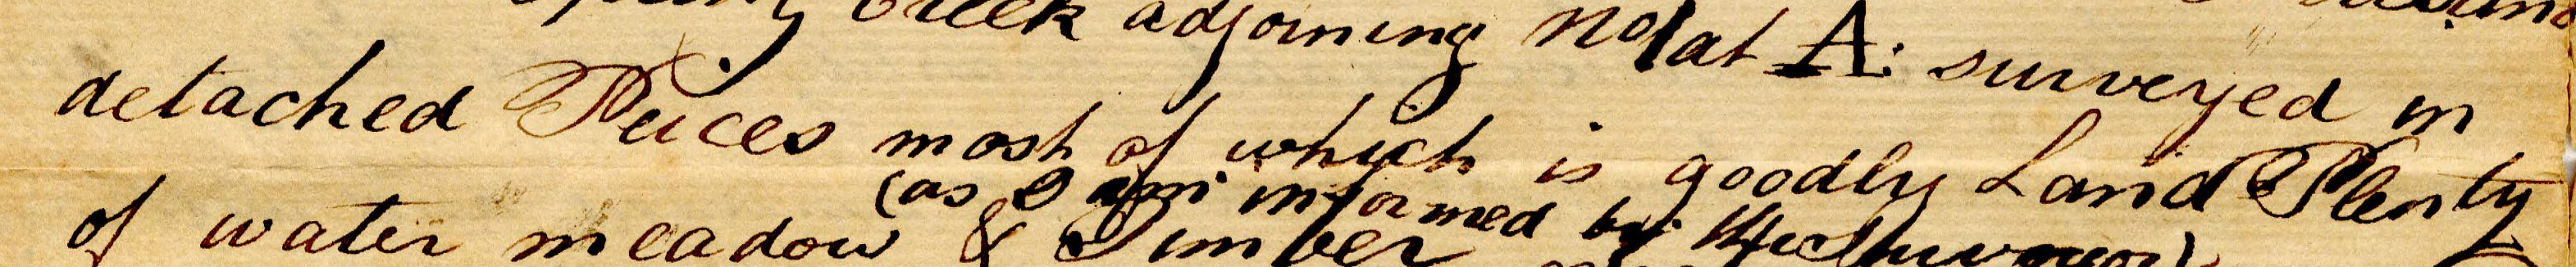detached Pieces most of which is goodly Land Plenty
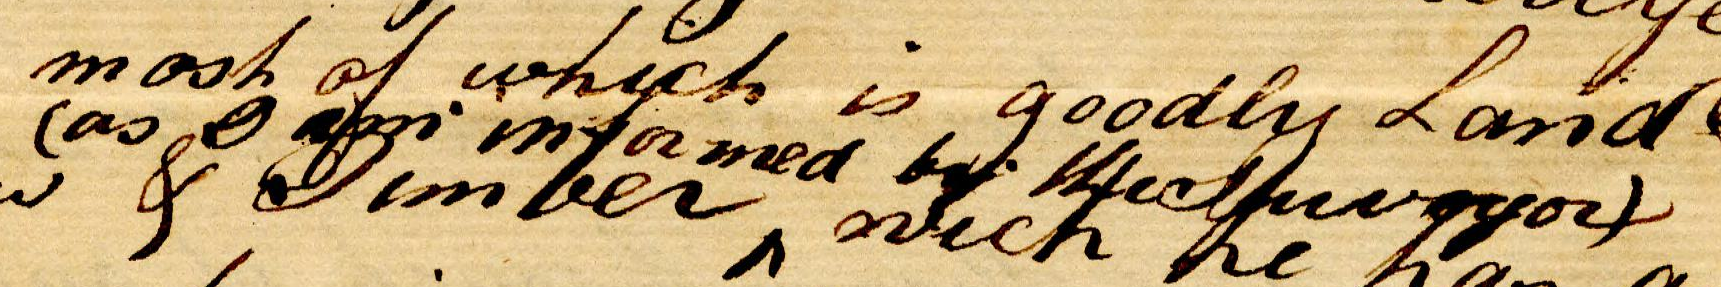(as I am informed by the surveyor)
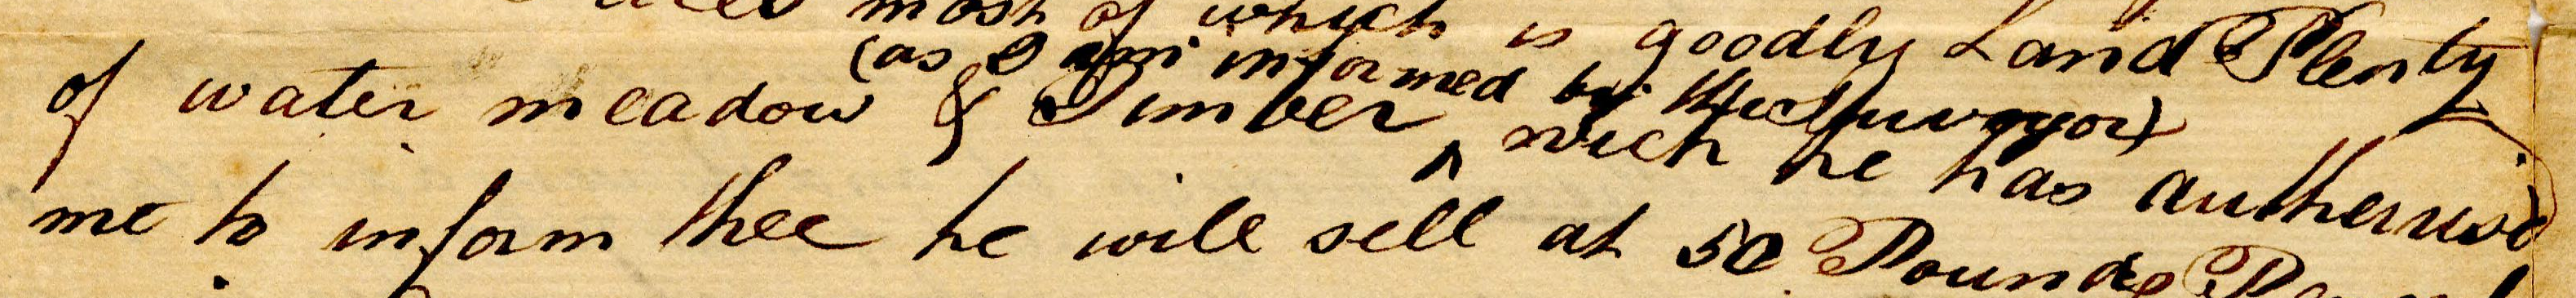of water meadow & Timber ^ wich he has autheris'd
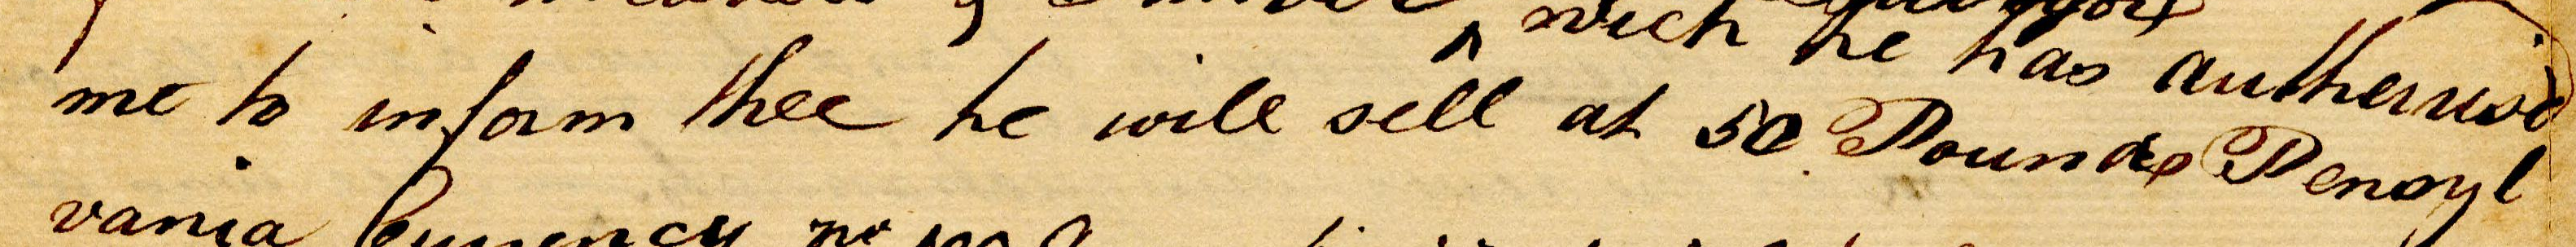me to inform thee he will sell at 50 Pounds Pensyl
